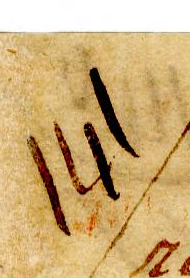141
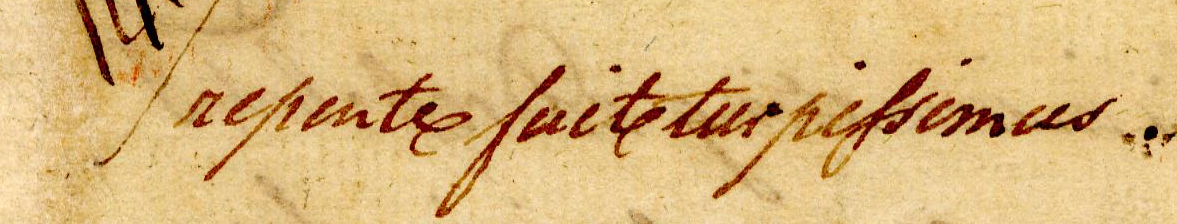repented suitetur pessimus.
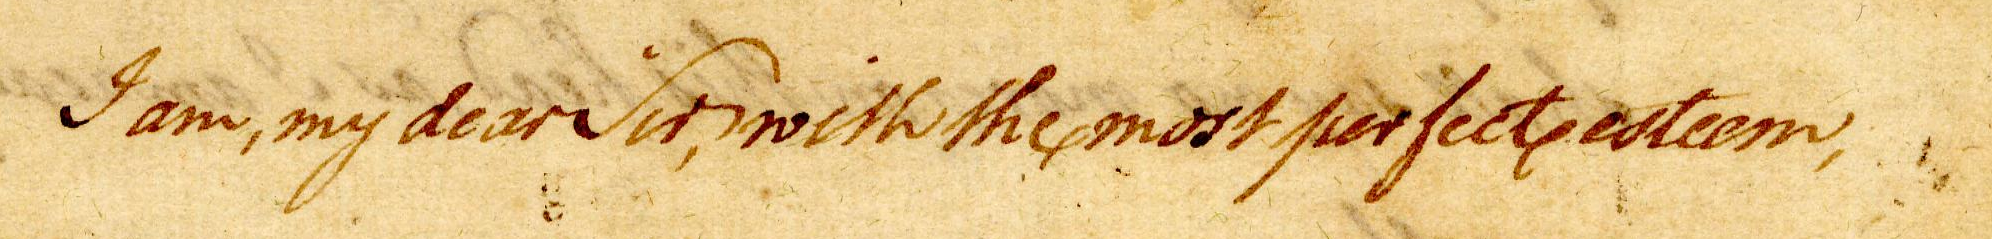I am, my dear Sir with the most perfect esteem,
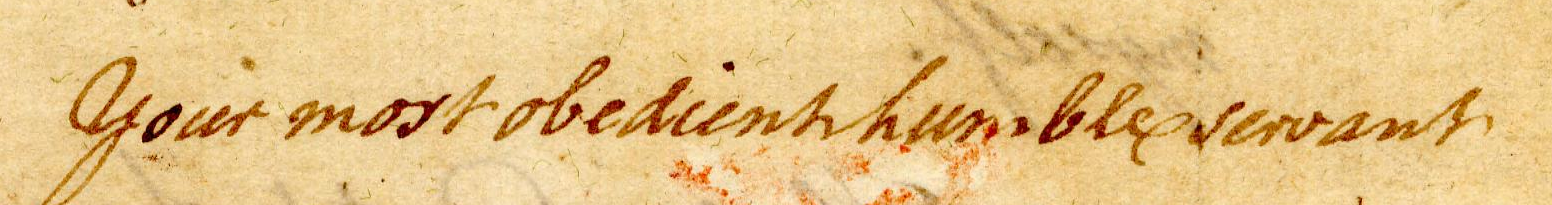your most obedient humble servant
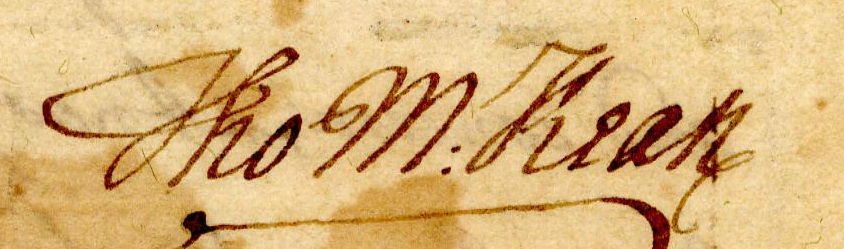Tho Mc:Kean
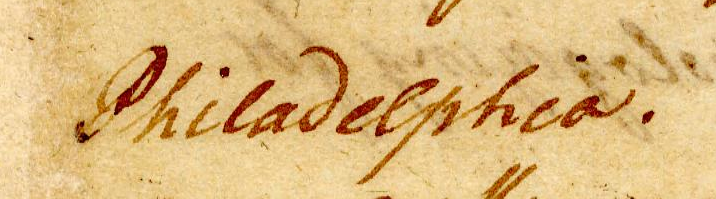Philadelphia.
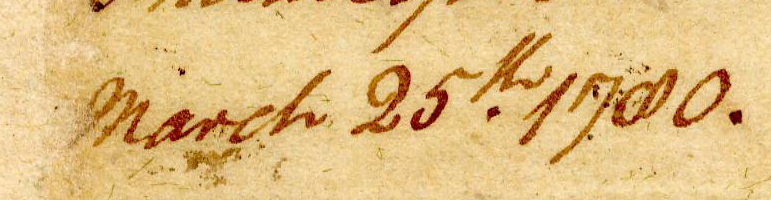March 25^th. 1780
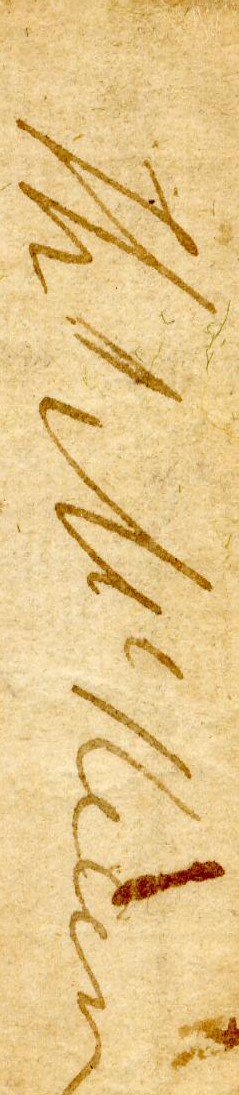th^s M^cKean
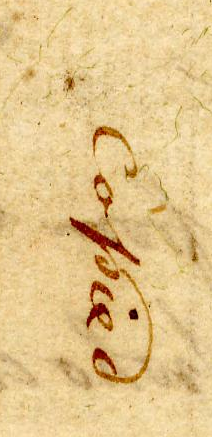Copied
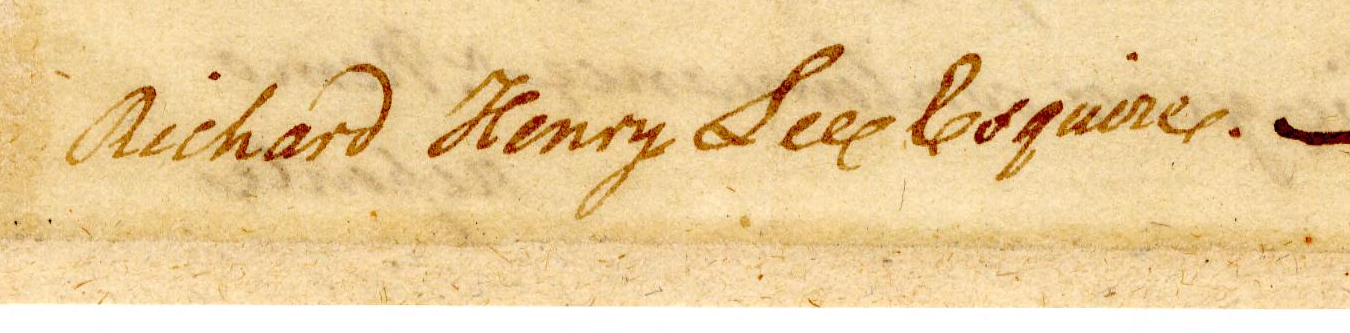Richard Henry Lee Esquire.-
